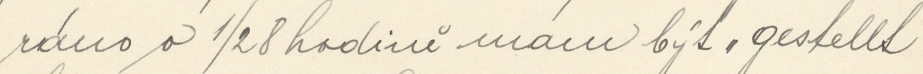ráno o 1/2 8 hodině mám být „gestellt“
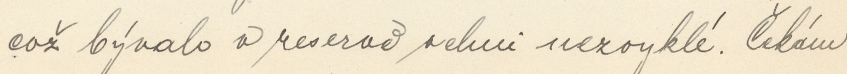což bývalo v reservě velmi nezvyklé. Čekám
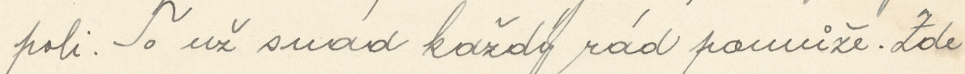poli. To už snad každý rád pomůže. Zde
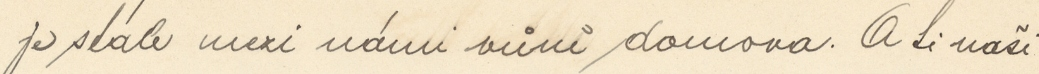je stále mezi námi vůně domova. A ti naši
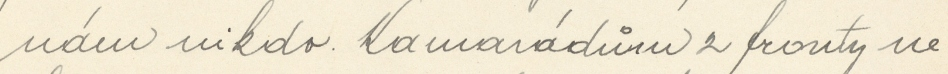nám nikdo. Kamarádům z fronty ne-
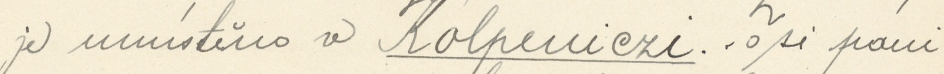je umístěno v Kolpeniczi. To si páni
